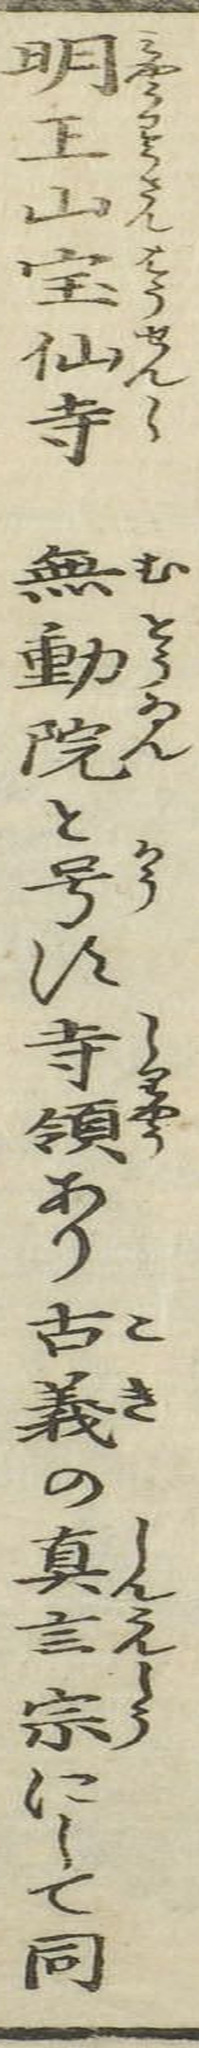明王山宝仙寺無動院と号す寺領あり古義の真言宗にして同
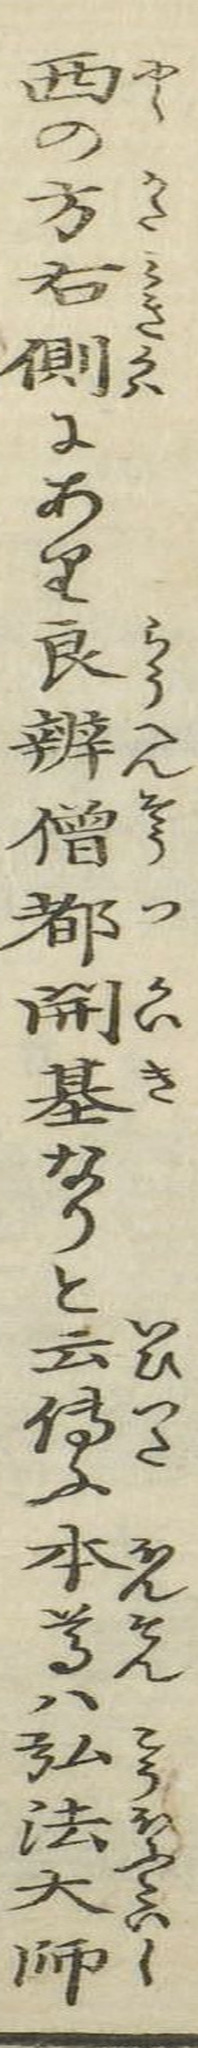西の方右側にあり良弁僧都開基なりと云伝ふ本尊は弘法大師
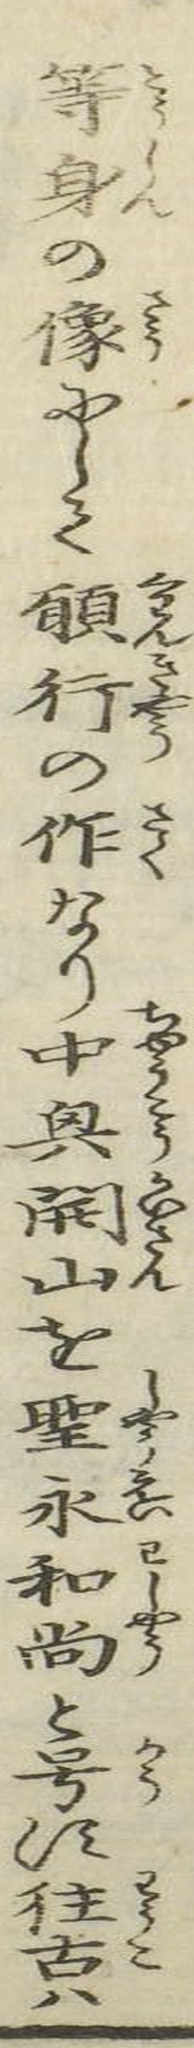等身の像にして願行の作なり中興開山を聖永和尚と号す往古は
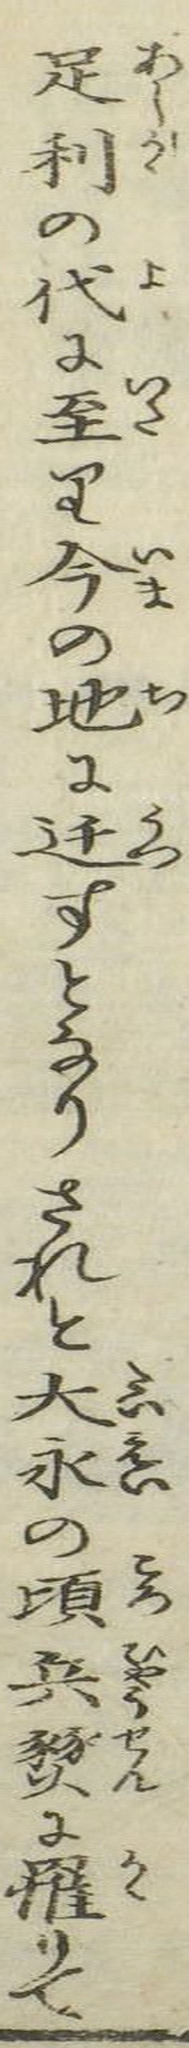足利の代に至り今の地に迂すとなりされと大永の頃兵燹に罹りて
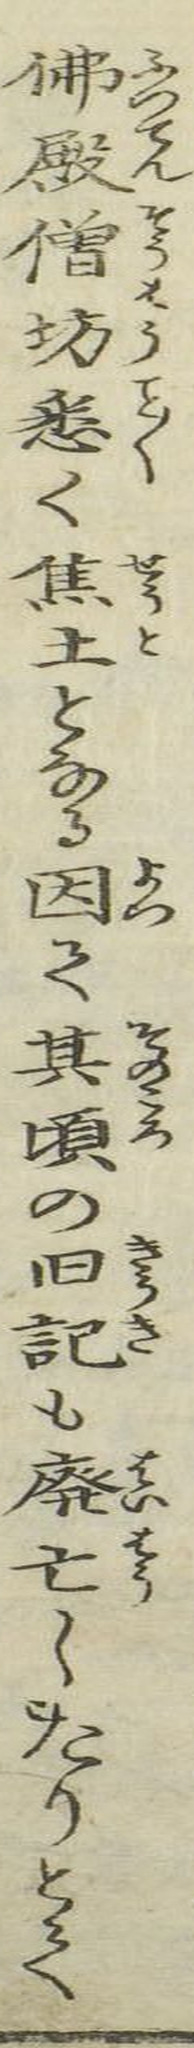仏殿僧坊悉く焦土となる因て其頃の旧記も廃亡したりとて
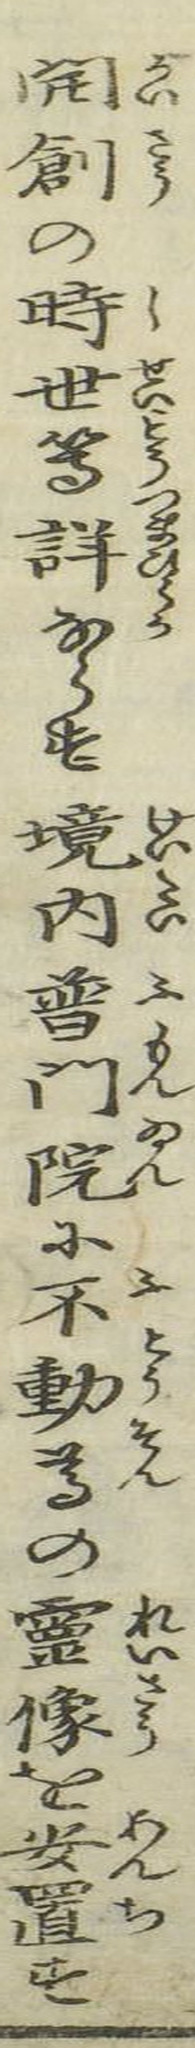開創の時世等詳ならす境内普門院に不動尊の霊像を安置す
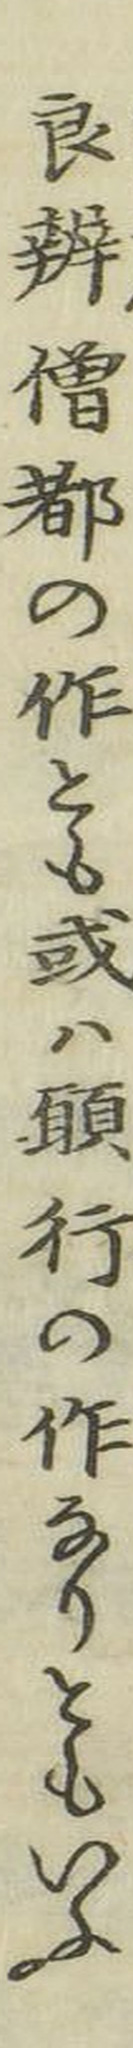良弁僧都の作とも或は願行の作なりともいふ

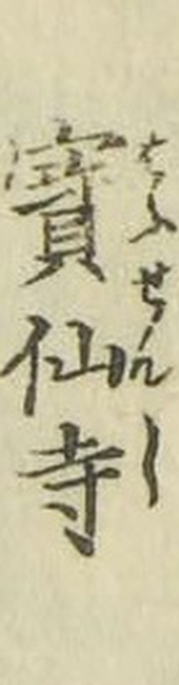宝仙寺
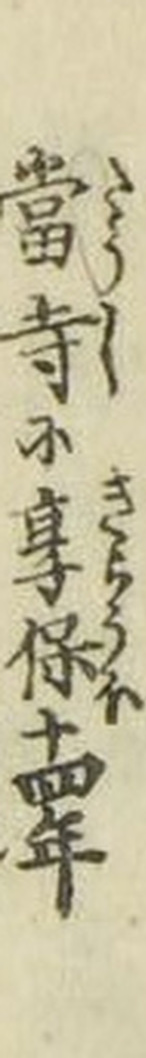当寺に享保十四年
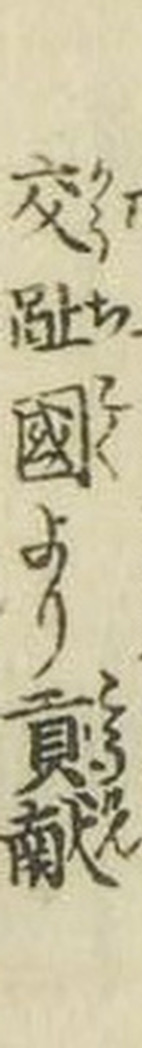交趾国より貢献
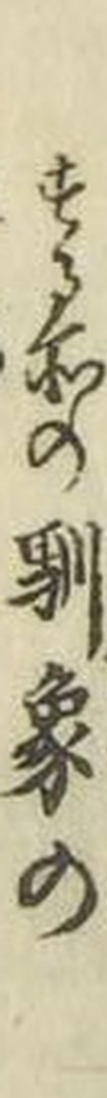する所の馴象の
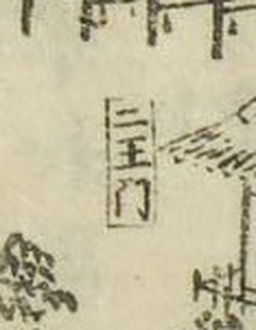二王門

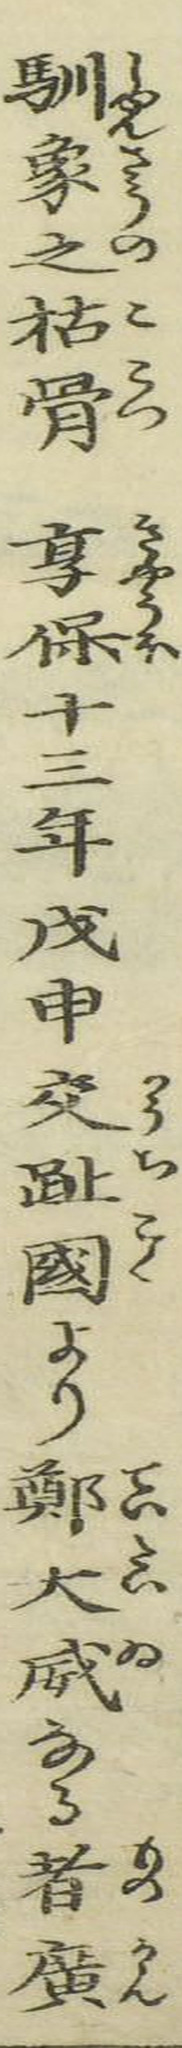馴象之枯骨享保十三年戊申交趾国より鄭大威なる者広
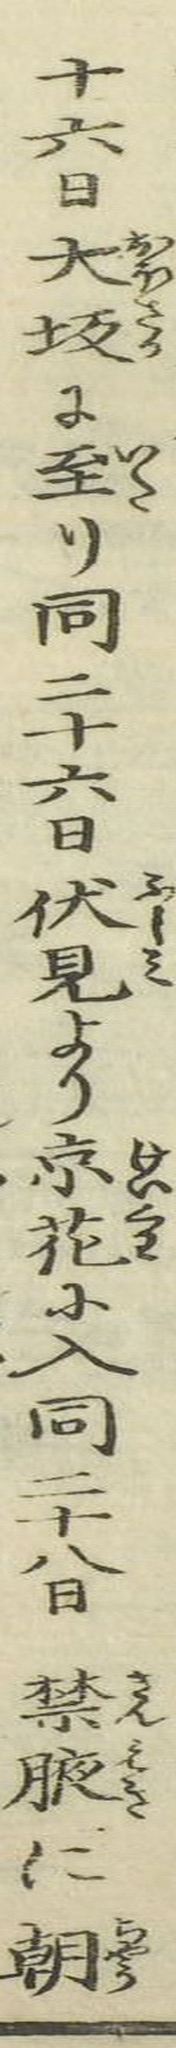十六日大坂に至り同二十六日伏見より京花に入同二十八日禁腋に朝
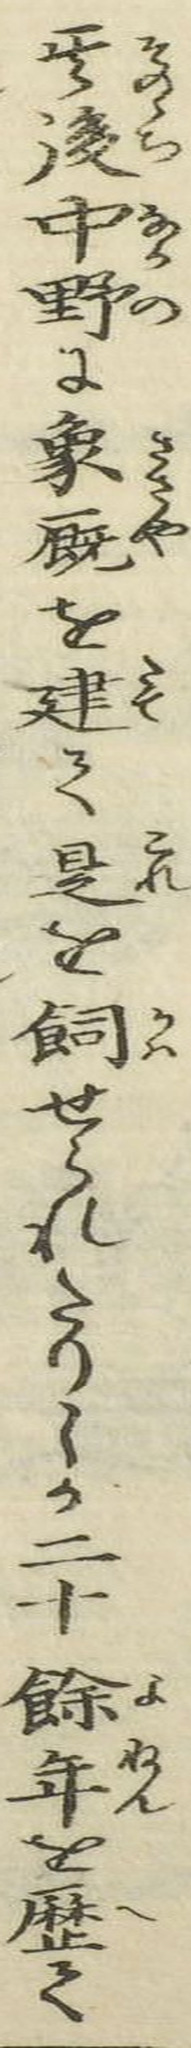其後中野に象厩を建て是を飼せられたりしか二十余年を歴て
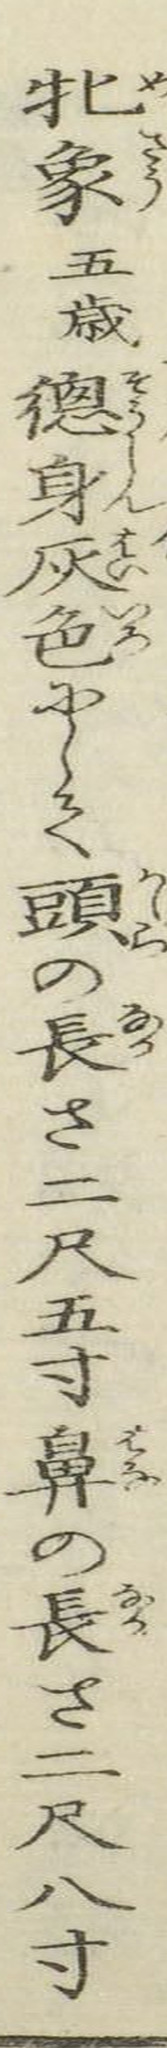牝象五歳総身灰色にして頭の長さ二尺五寸鼻の長さ二尺八寸
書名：江戸名所図会 20巻 巻之11
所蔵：東京学芸大学教育コンテンツアーカイブ
